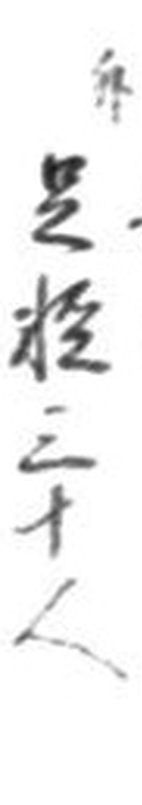足軽三十人

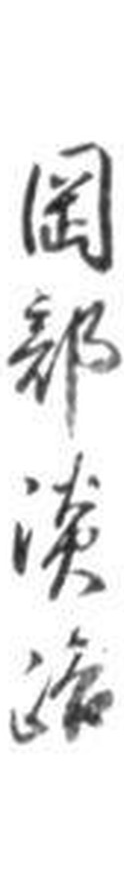岡部淡路
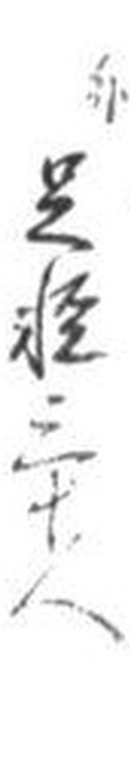足軽三十人
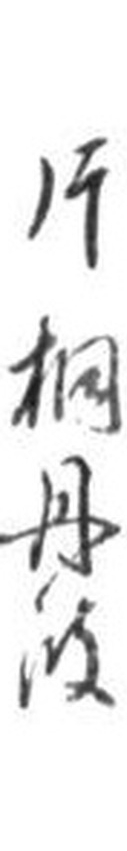片桐丹波
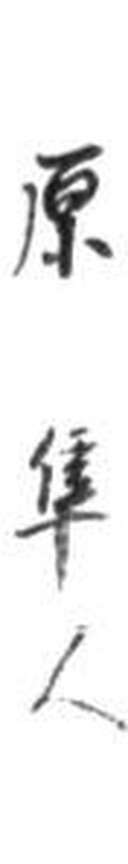原隼人
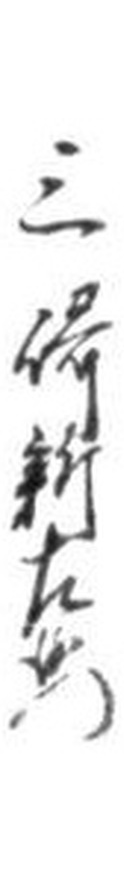三崎新左衛門
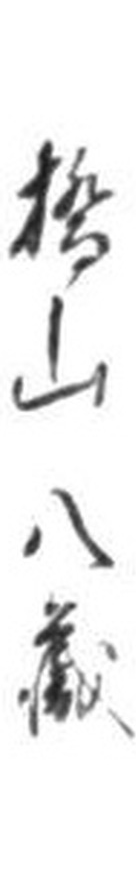橋山八蔵
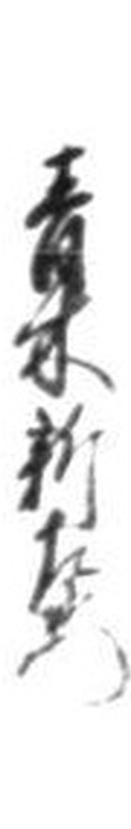青木新左衛門
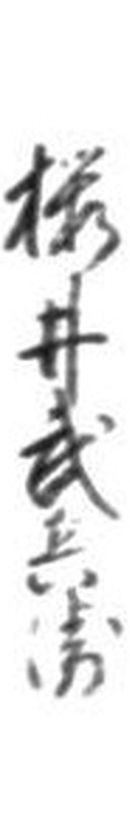桜井武兵衛
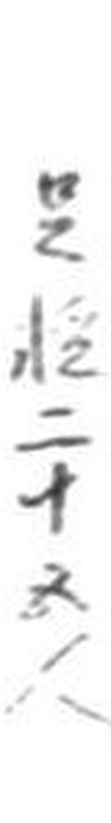足軽二十五人
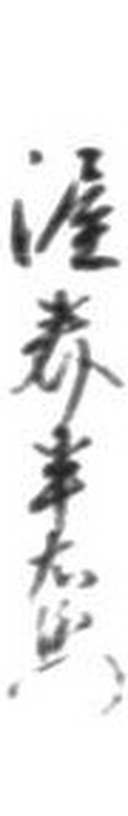渥美半右衛門
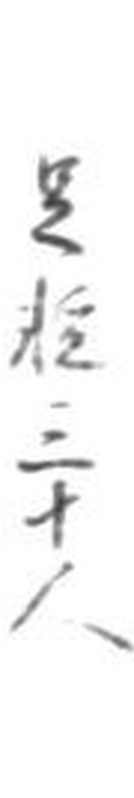足軽三十人
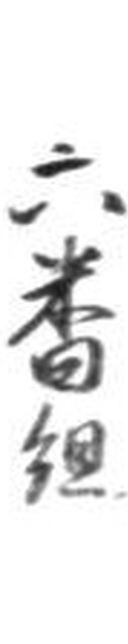六番組
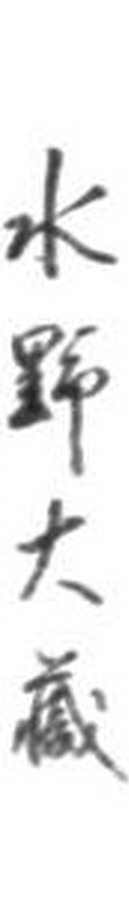水野大蔵
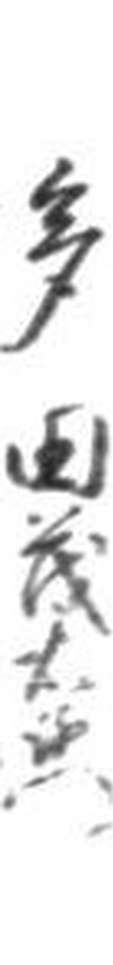多田茂右衛門
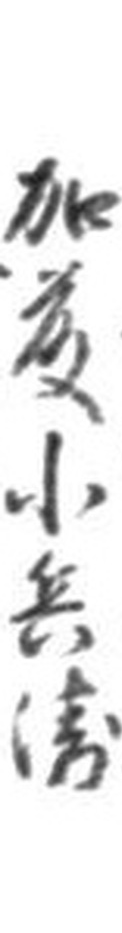加藤小兵衛
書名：家譜 二 忠直公 従文禄四年到慶安四年
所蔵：福井県文書館 Fukui Prefectural Archives
